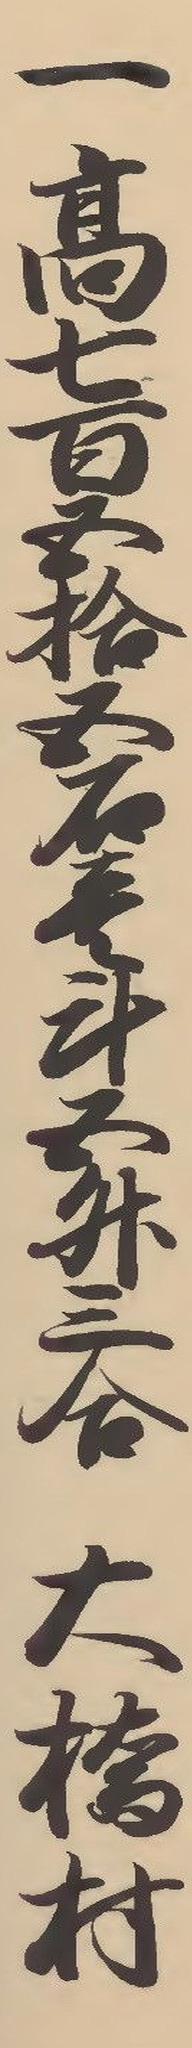一高七百五拾五石壱斗五升三合大橋村
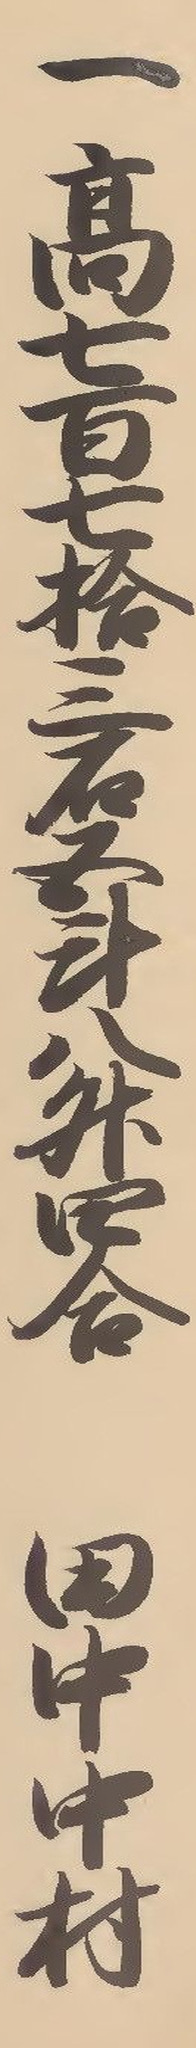一高七百七拾三石五斗八升四合田中中村
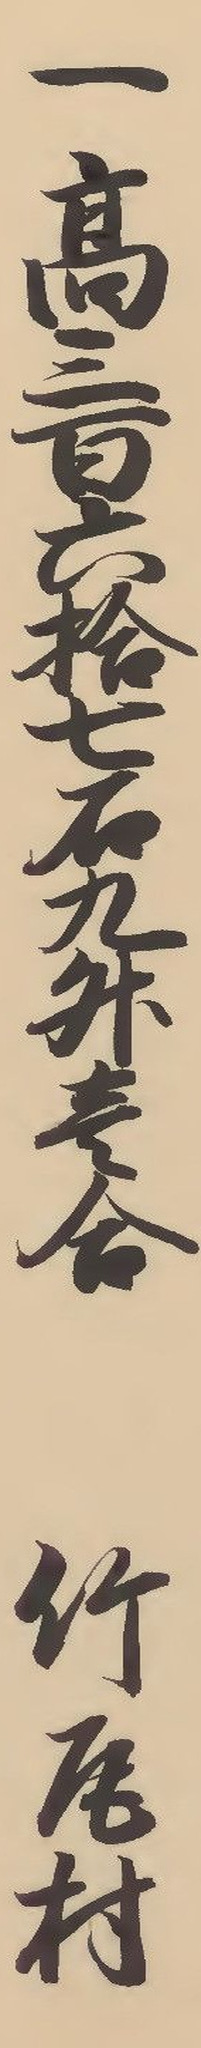一高三百六拾七石九升壱合竹尾村
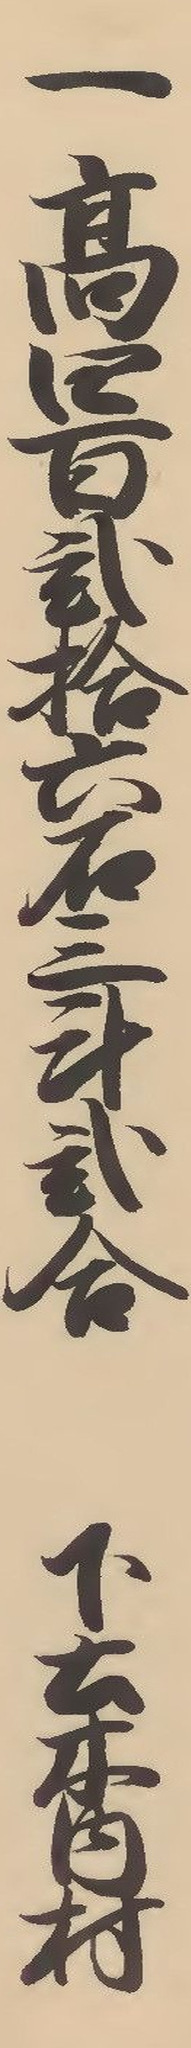一高四百弐拾六石三斗弐合下土木内村
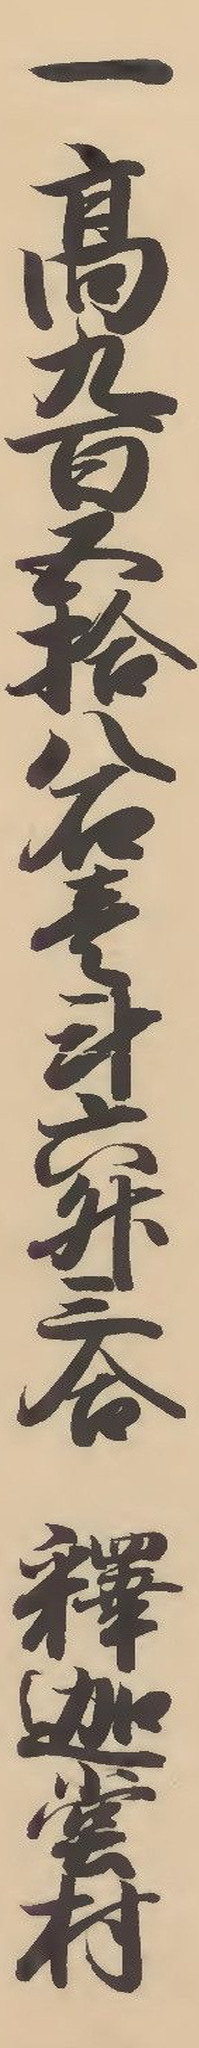一高九百五拾八石壱斗六升三合釈迦堂村

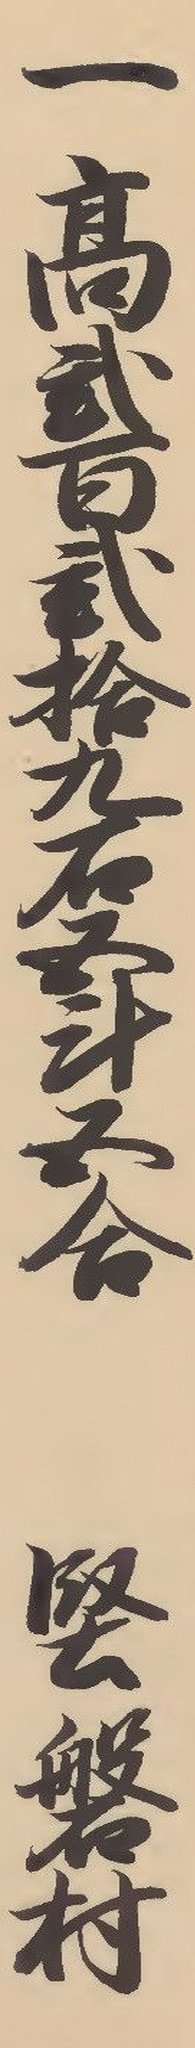一高弐百弐拾九石五斗五合堅磐村
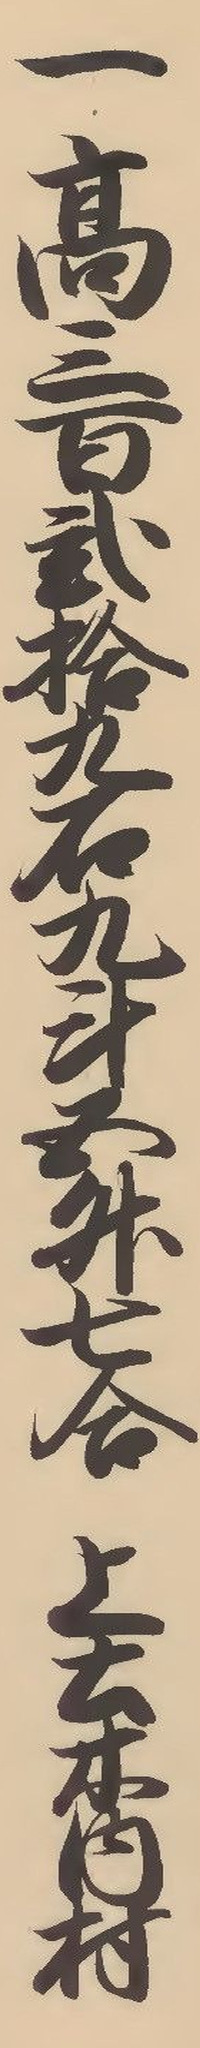一高三百弐拾九石九斗五升七合上土木内村
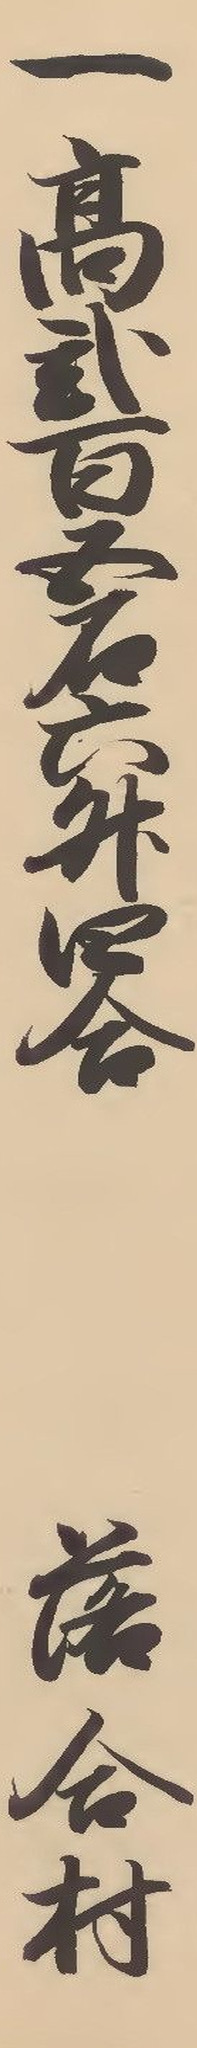一高弐百五石六升四合落合村
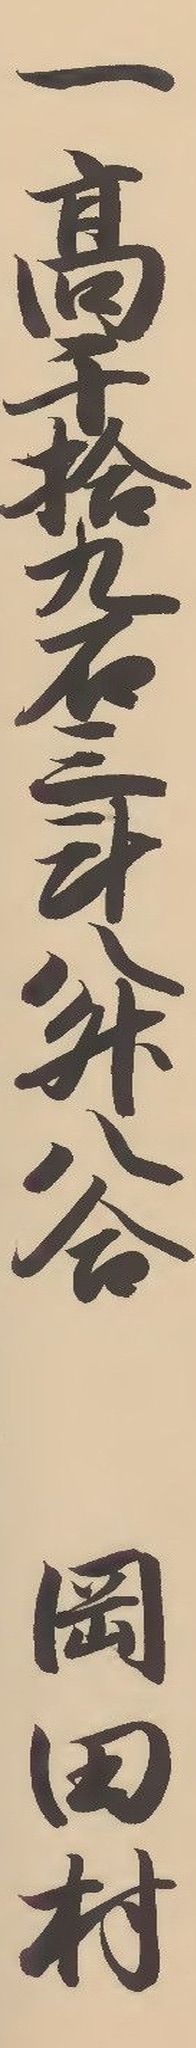一高千拾九石三斗八升八合岡田村
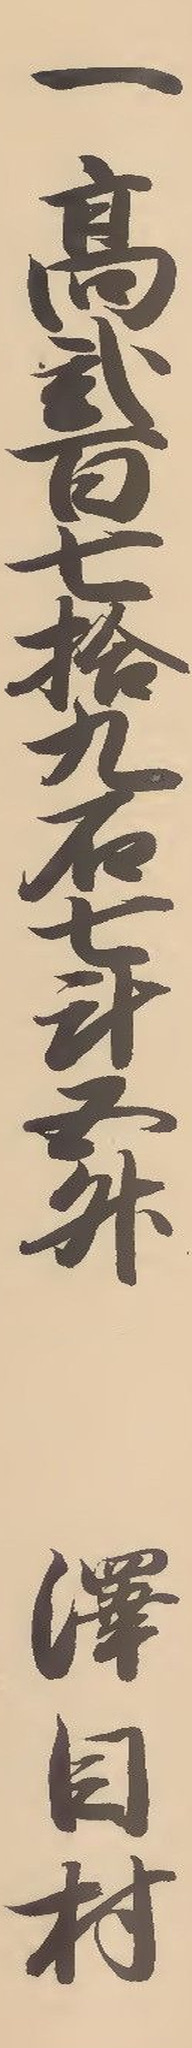一高弐百七拾九石七斗五升沢目村
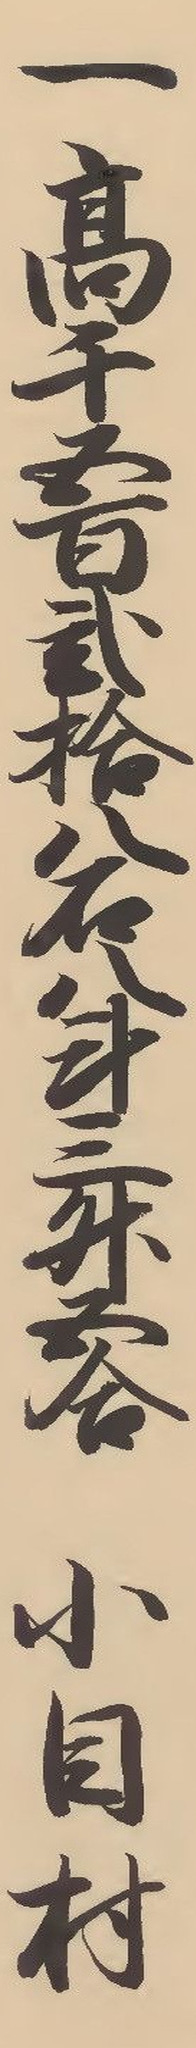一高千五百弐拾八石八斗三升五合小目村
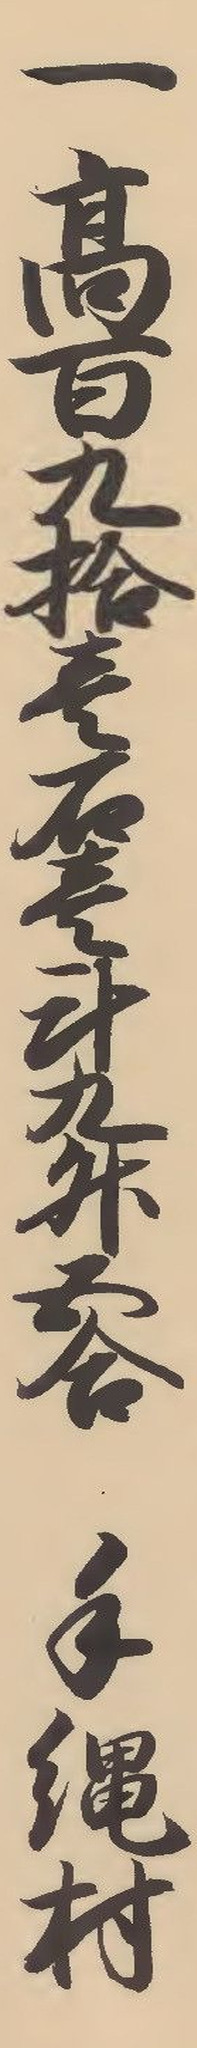一高百九拾壱石壱斗九升五合手縄村
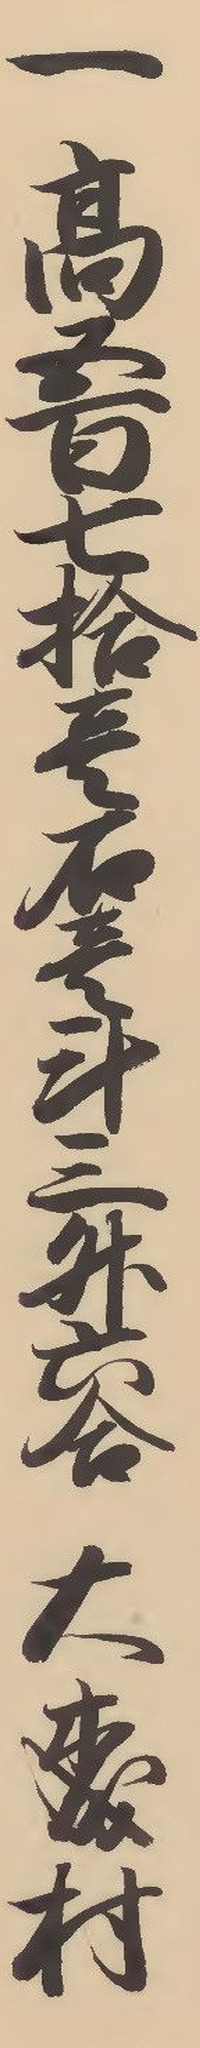一高五百七拾壱石壱斗三升六合大森村

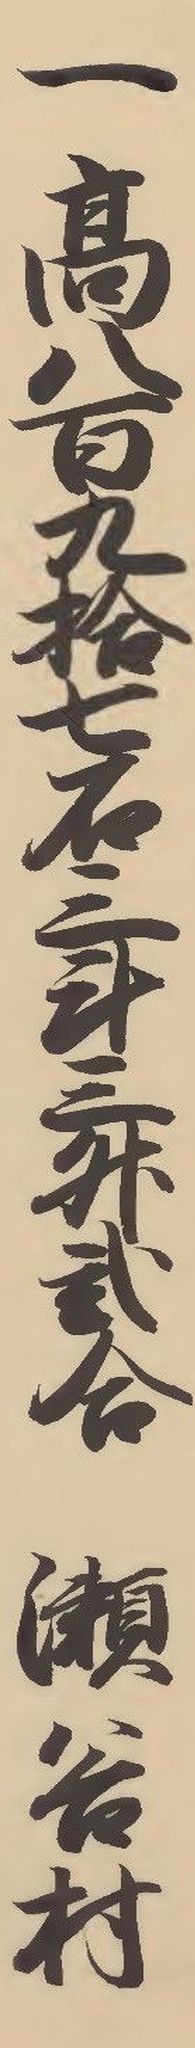一高八百九拾七石三斗三升弐合瀬谷村
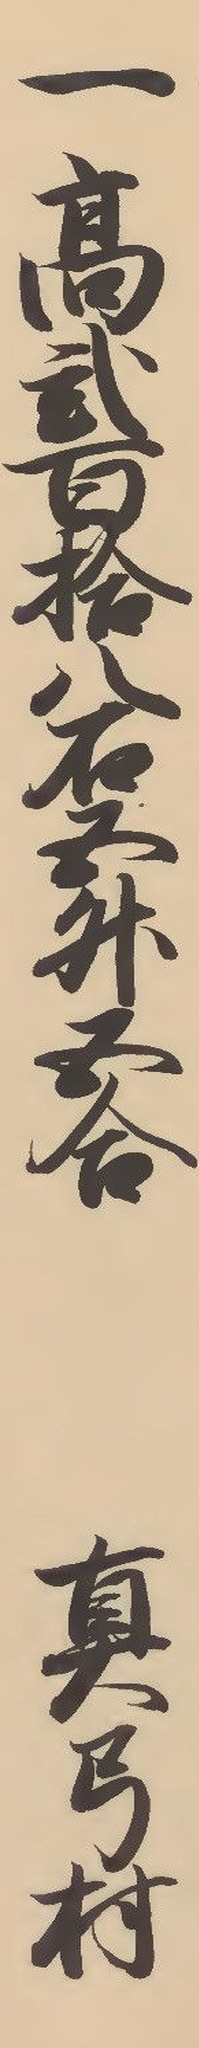一高弐百拾八石五升五合真弓村
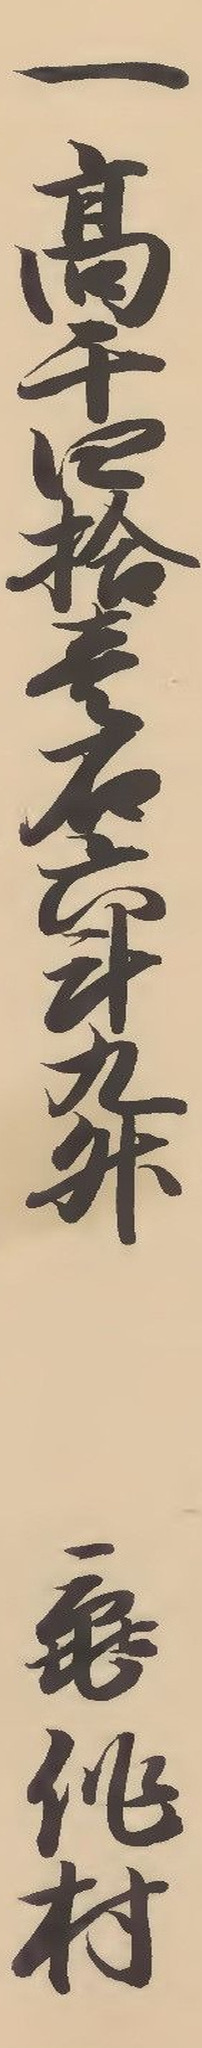一高千四拾壱石六斗九升亀作村
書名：常陸国郷帳
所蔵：国立公文書館 National Archives of Japan
